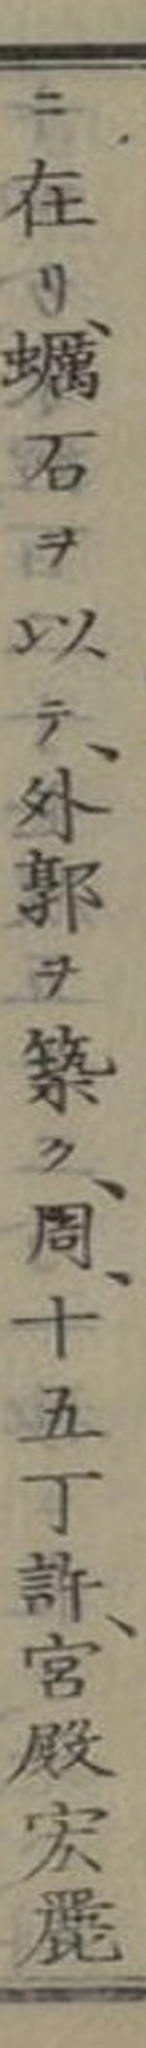ニ在リ、蠣石ヲ以テ、外郭ヲ築ク、周、十五丁許、宮殿宏麗
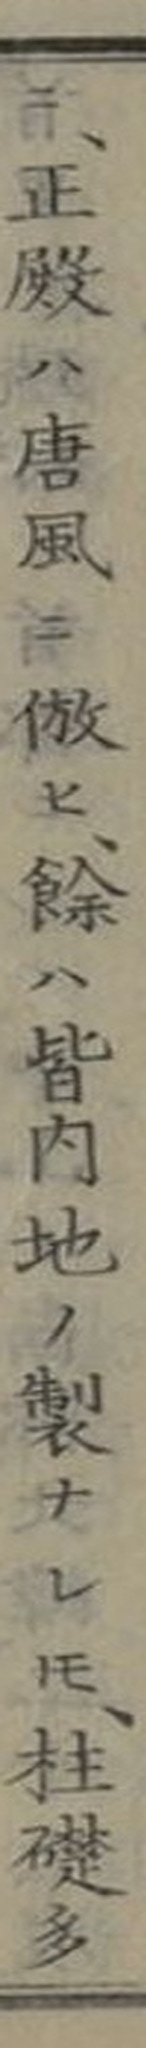ニ、正殿ハ唐風ニ倣ヒ、余ハ皆内地ノ製ナレトモ、柱礎多
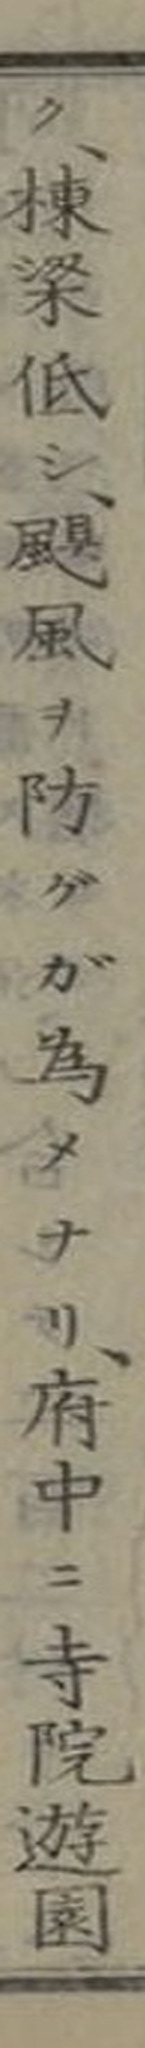ク、棟梁低シ、颶風ヲ防グガ為メナリ、府中ニ寺院遊園
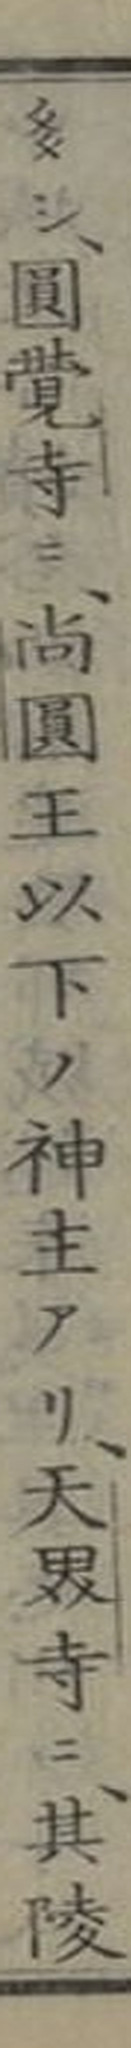多シ、円覚寺ニ、尚円王以下ノ神主アリ、天界寺ニ、其陵
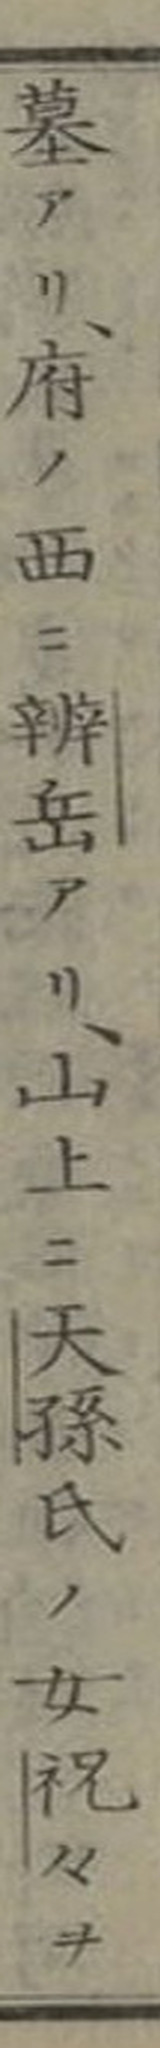墓アリ、府ノ西ニ弁岳アリ、山上ニ天孫氏ノ女祝々ヲ
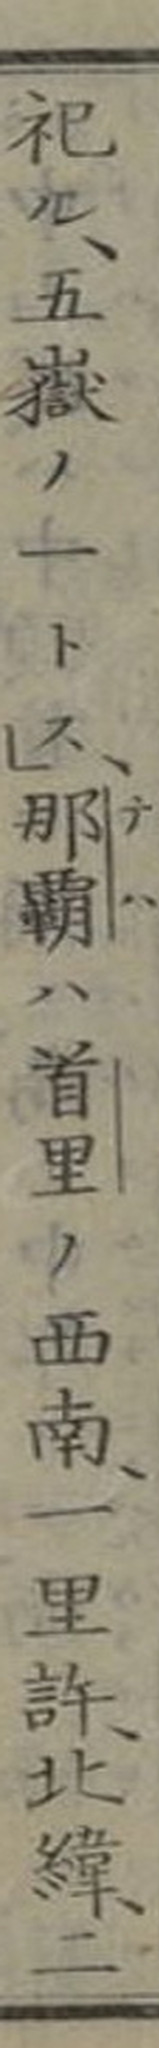祀ル、五岳ノ一トス、」那覇ハ首里ノ西南、一里許、北緯、二
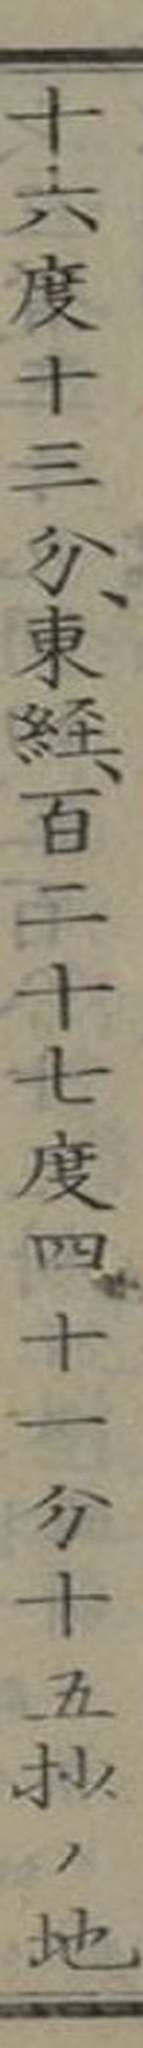十六度十三分、東経、百二十七度四十一分十五秒ノ地
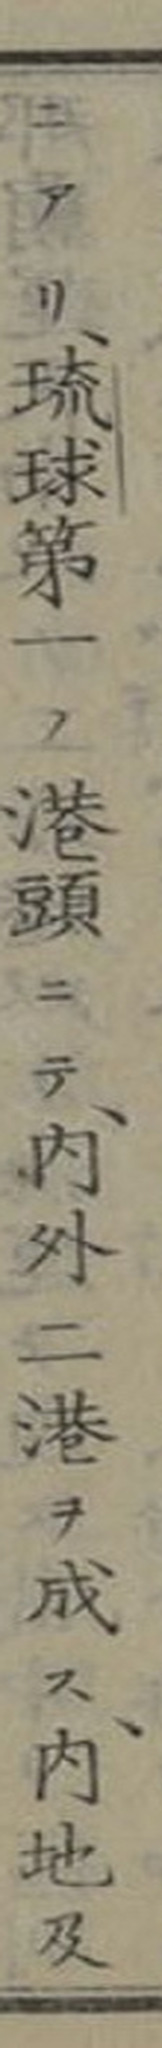ニアリ、琉球第一ノ港頭ニテ、内外二港ヲ成ス、内地及
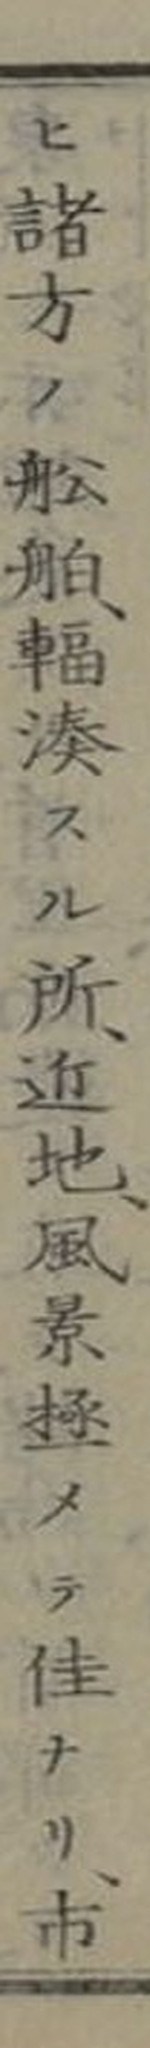ヒ諸方ノ船舶、輻湊スル所、近地、風景極メテ佳ナリ、市
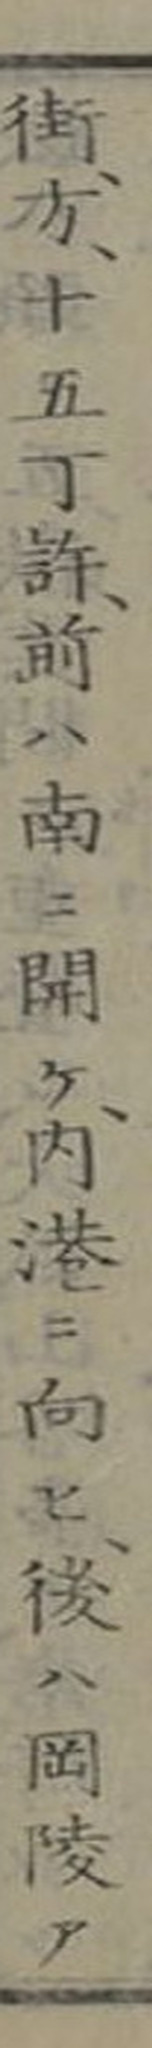街、方、十五丁許、前ハ南ニ開ケ、内港ニ向ヒ、後ハ岡陵ア
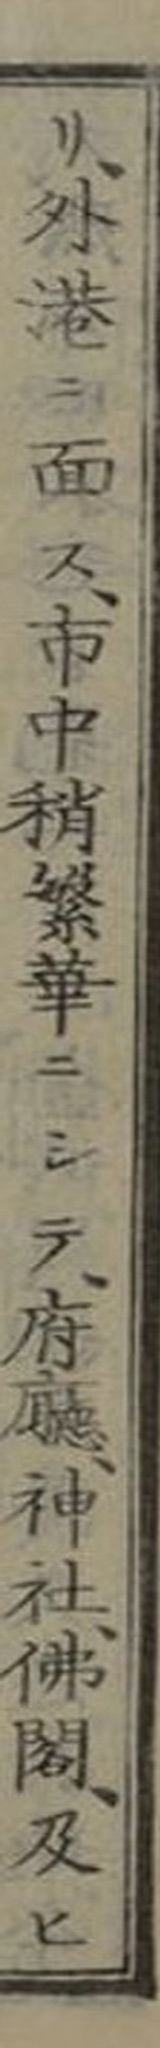リ、外港ニ面ス、市中稍繁華ニシテ、府庁、神社、仏閣、及ヒ
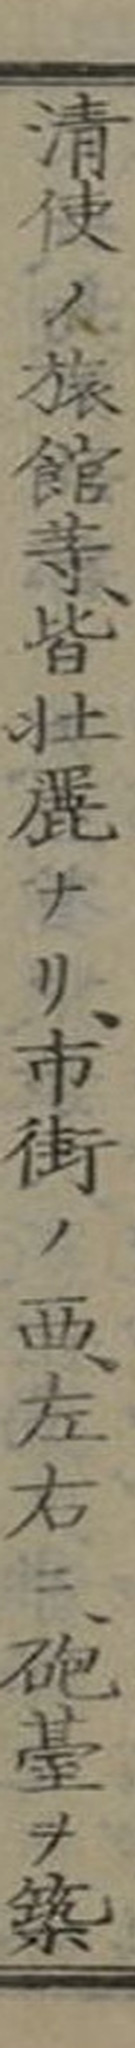清使ノ旅館等、皆壮麗ナリ、市街ノ西、左右ニ、砲台ヲ築
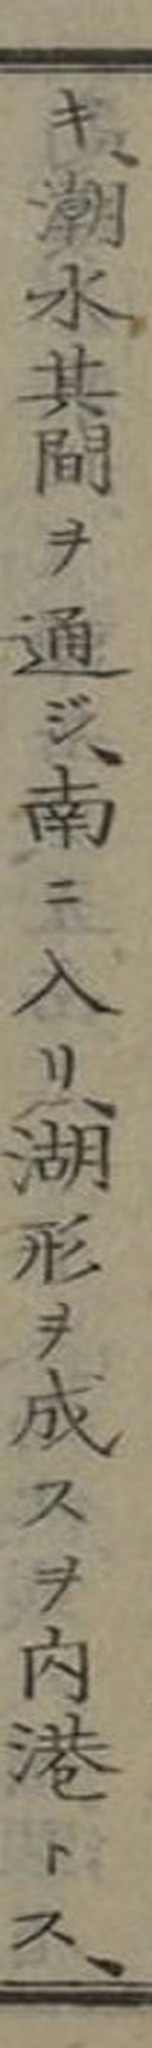キ、潮水其間ヲ通ジ、南ニ入リ、湖形ヲ成スヲ内港トス、
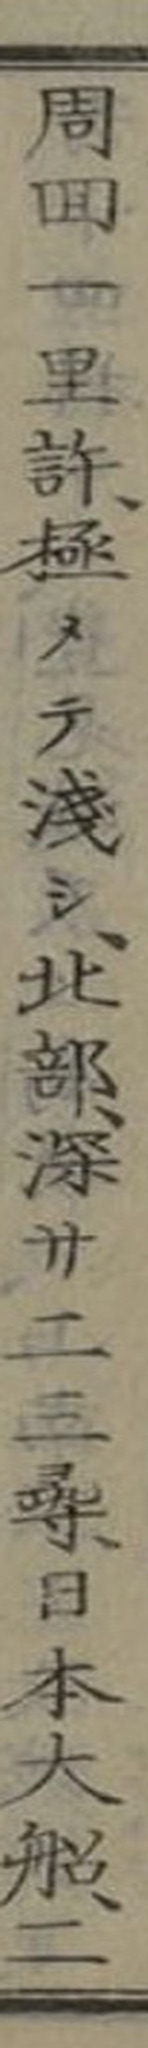周囲一里許、極メテ浅シ、北部、深サ二三尋、日本大船、二
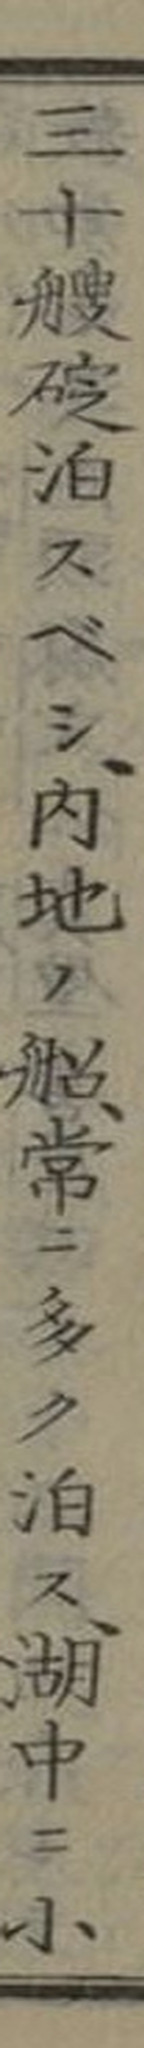三十艘碇泊スベシ、内地ノ船、常ニ多ク泊ス、湖中ニ小
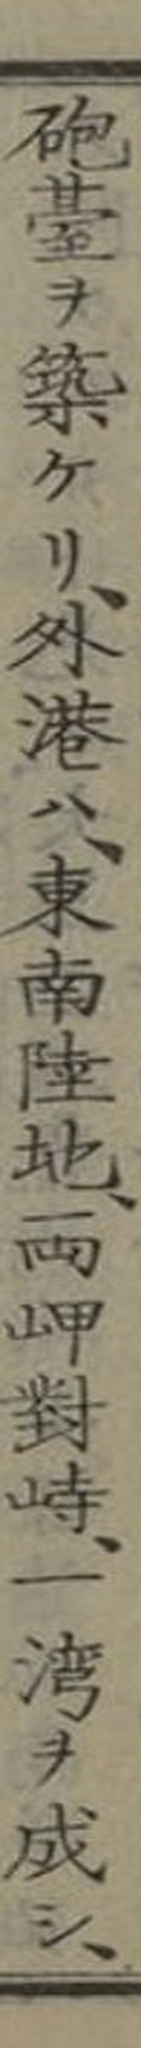砲台ヲ築ケリ、外港ハ、東南陸地、両岬対峙、一湾ヲ成シ、
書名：琉球新誌 図附 上
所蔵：University of the Ryukyus Library
